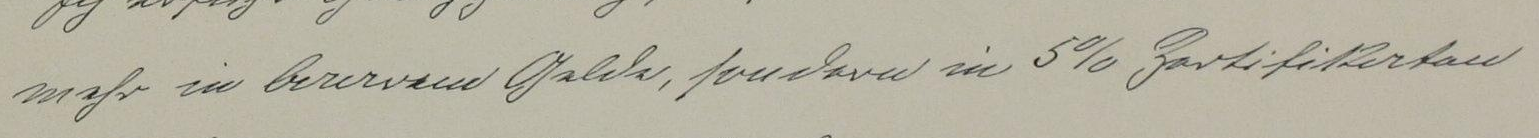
mehr in baarem Gelde, sondern in 5% Zertifikaten
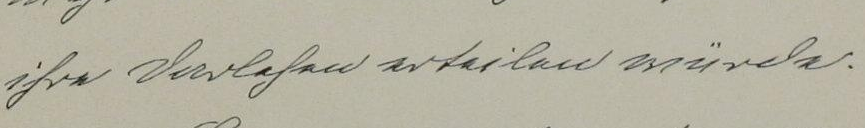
ihre Darlehen erteilen würde.
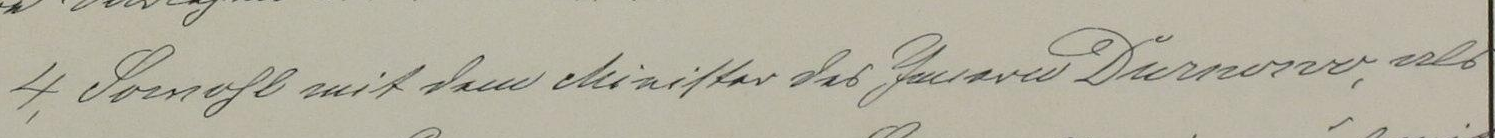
4. Sowohl mit dem Minister des Innern Durnowo als
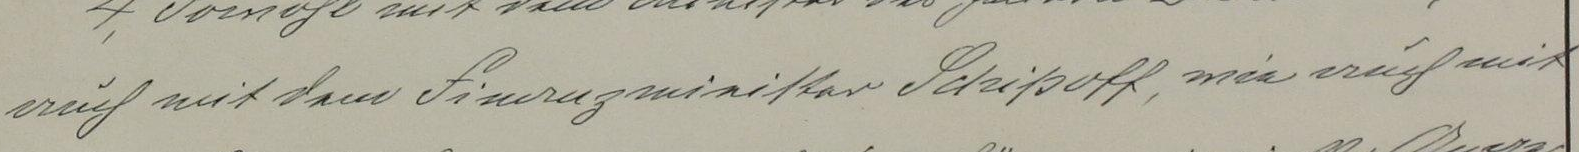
auch mit dem Finanzminister Schipoff, wie auch mit
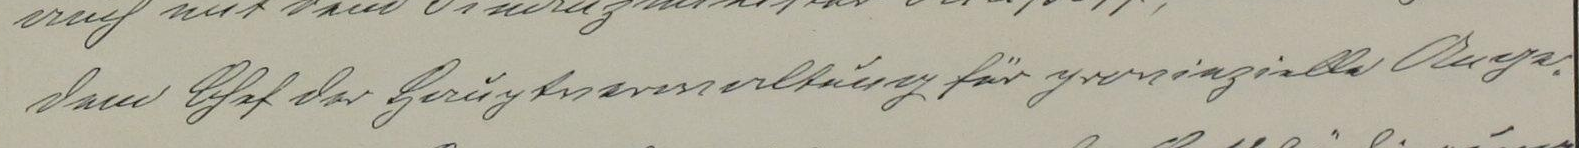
dem Chef der Hauptverwaltung für provinzielle Ange-
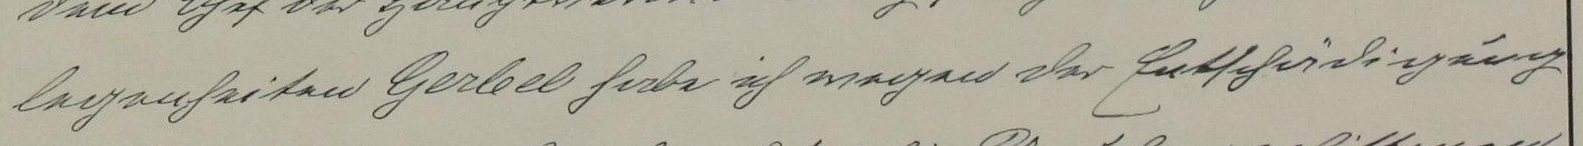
legenheiten Gerbel habe ich wegen der Entschädigung
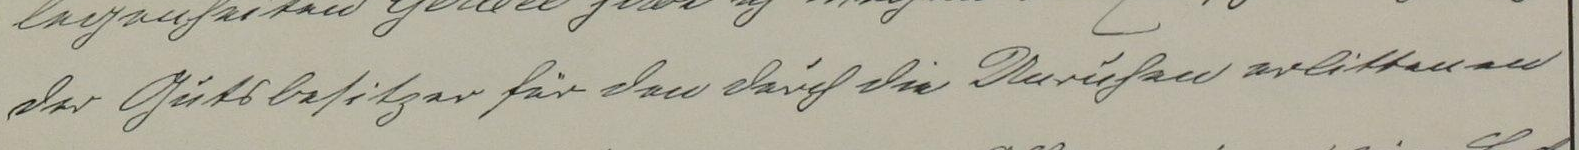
der Gutsbesitzer für den durch die Unruhen erlittenen
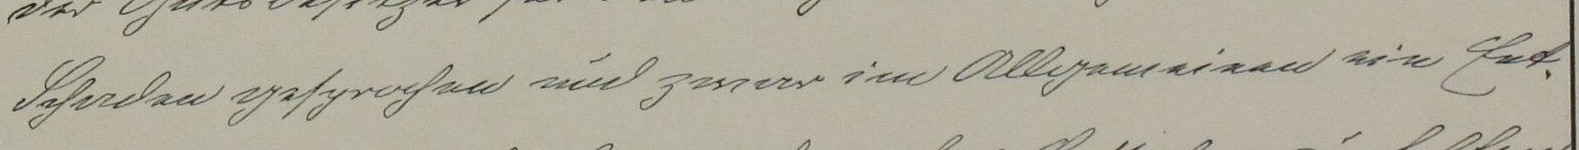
Schaden gesprochen und zwar im Allgemeinen ein Ent-
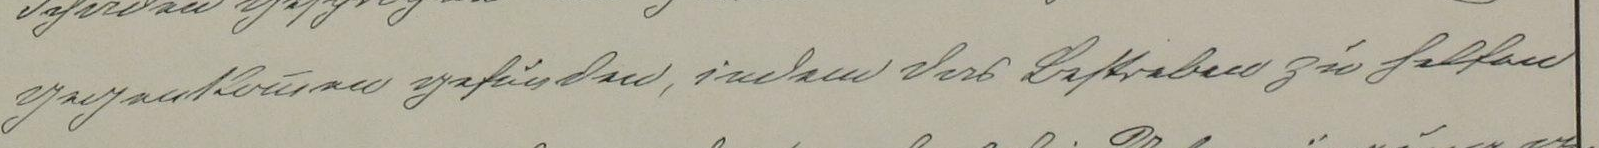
gegenkommen gefunden, indem das Bestreben zu helfen
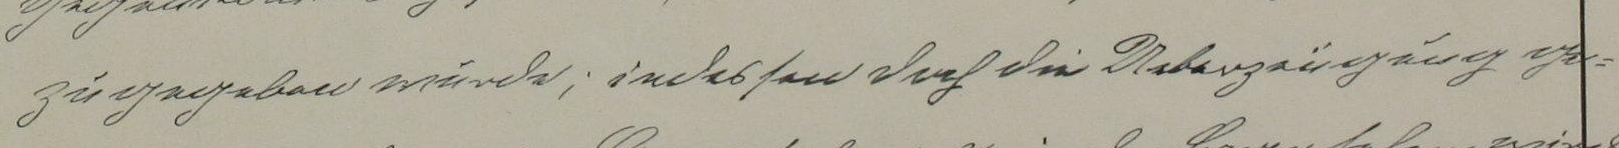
zugegeben wurde; indessen doch die Ueberzeugung ge-
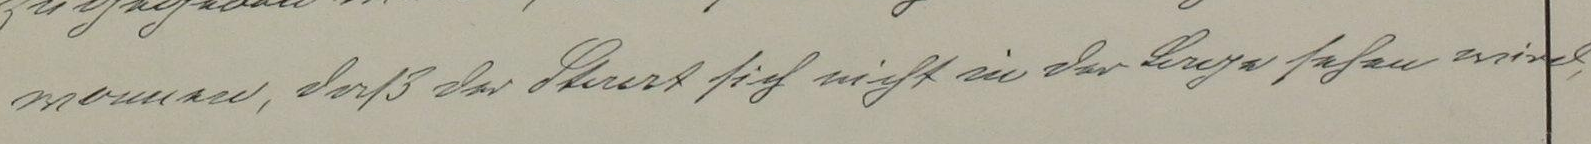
wonnen, daß der Staat sich nicht in der Lage sehen wird,
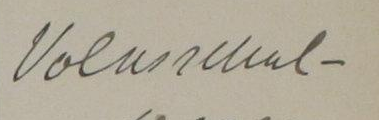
Volksschul-
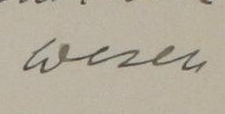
wesen
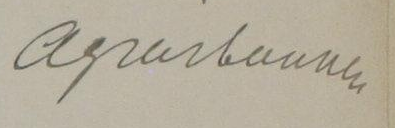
Agrarbanken
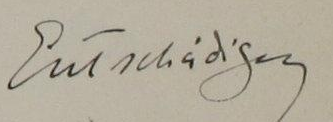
Entschädigung
